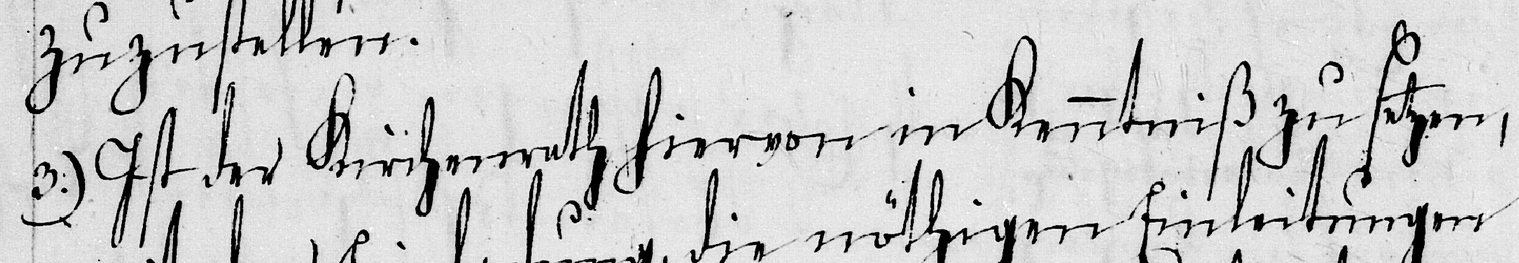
3.) Ist der Kirchenrath hiervon in Kenntniß zu setzen,
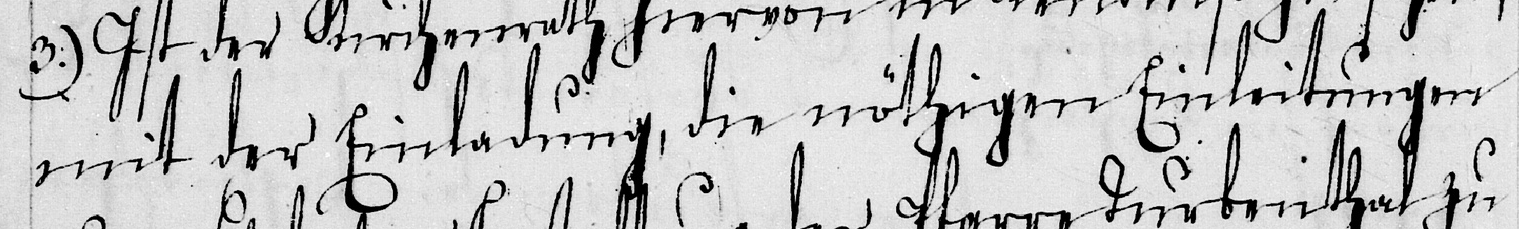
mit der Einladung, die nöthigen Einleitungen
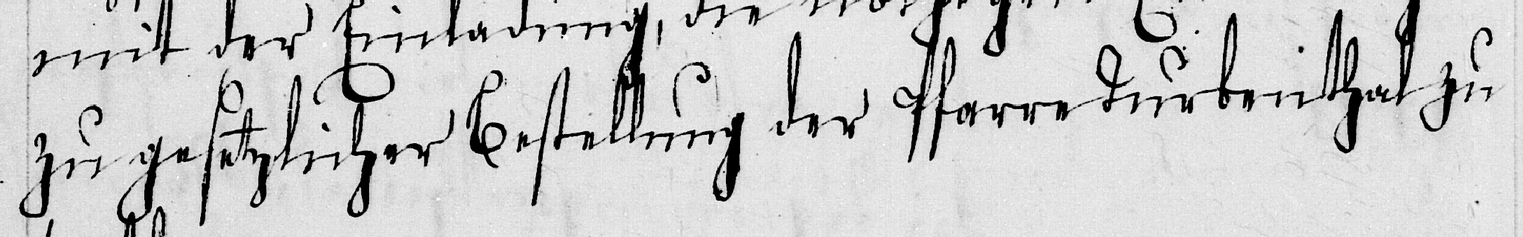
zu gesetzlicher Bestellung der Pfarre Turbenthal zu
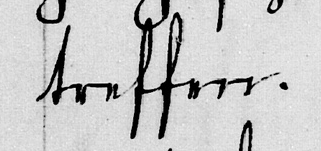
treffen.
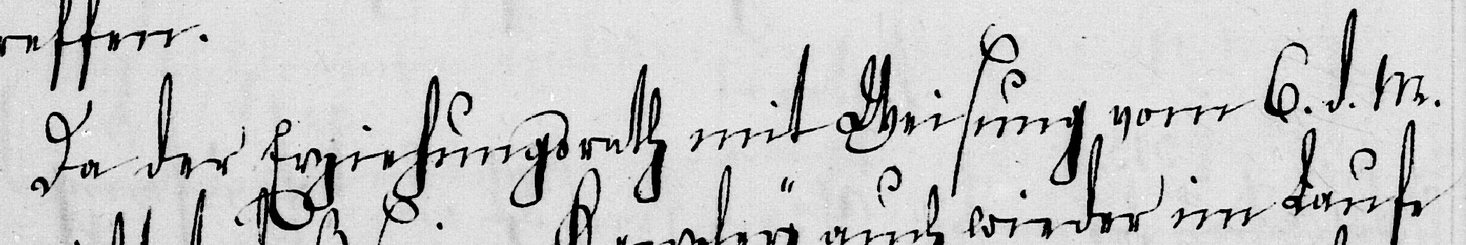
Da der Erziehungsrath mit Weisung vom 6. d. M.
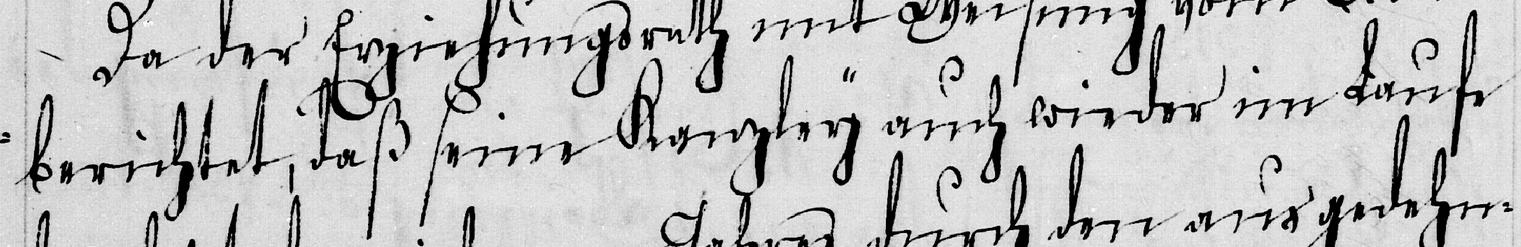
berichtet, daß seine Kanzley auch wieder im Laufe
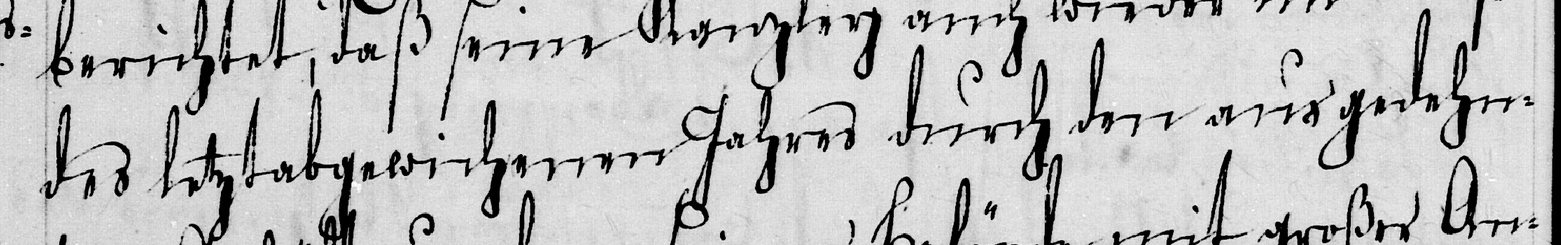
des letzabgewichenen Jahres durch den ausgedehn¬
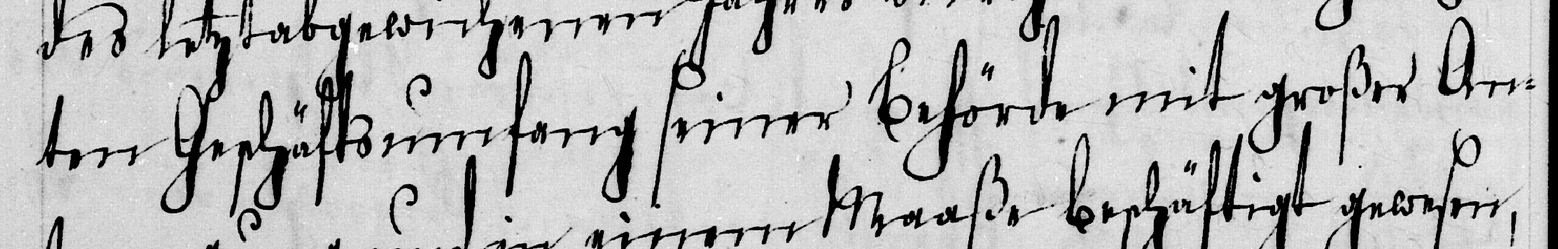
ten Geschäftsumfang seiner Behörde mit großer An¬
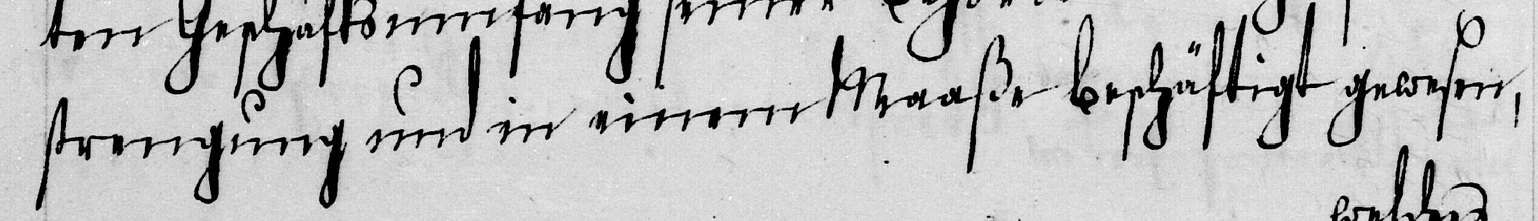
strengung und in einem Maaße beschäftigt gewesen,
